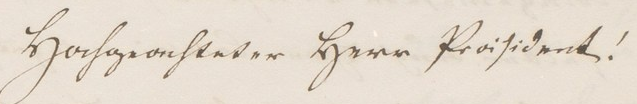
Hochgeachteter Herr Präsident!
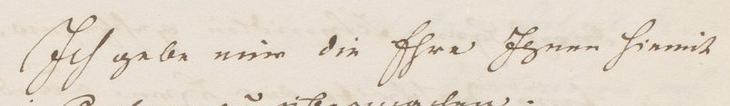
Ich gebe mir die Ehre Ihnen hiemit
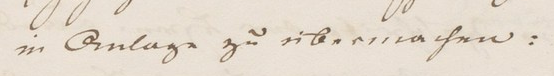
in Alage zu übermachen:
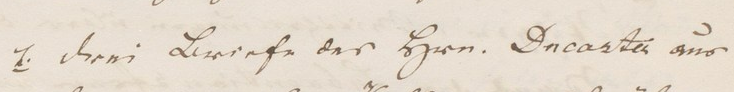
1. Drei Briefe des Hrn. Ducoster aus
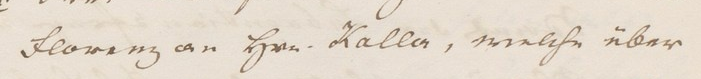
Florenz an Hrn. Koller, welche über
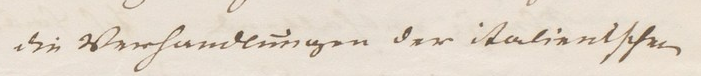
die Verhandlungen der italienischen
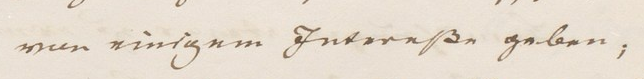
von einigem Intereße geben;
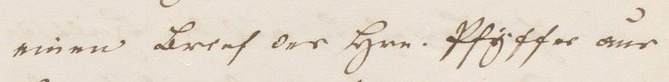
einen Brief des Hrn. Pfyffer aus
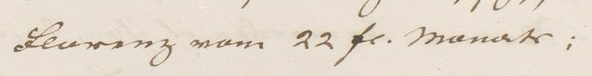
Florenz vom 22 fl. Monats ;
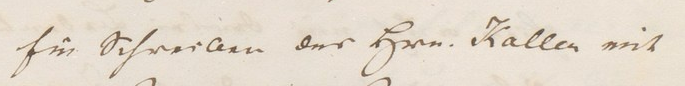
Ein Schreiben des Hrn. Koller mit
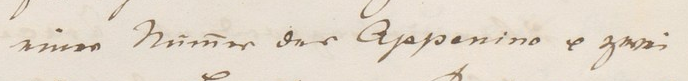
einer Nummer des Appenino & zwei
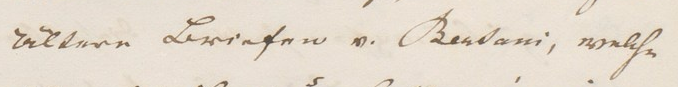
ältern Briefen v. Bertani, welche
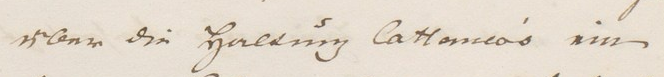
über die Haltung Cattaneo's ein
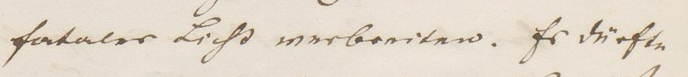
fatales Licht verbreiten. Es dürfte
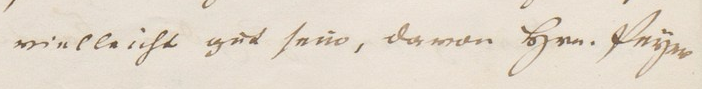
vielleicht gut sein, davon Hrn. Peyer
